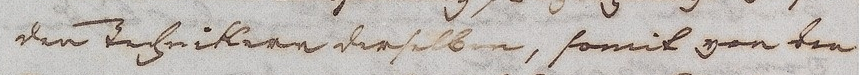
den Technikern derselben, somit von den
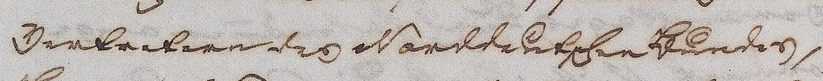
Vertretern des Norddeutschen Bundes,
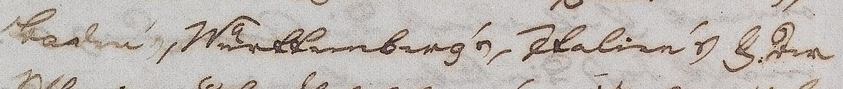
Baden's, Württemberg's, Italien's & der
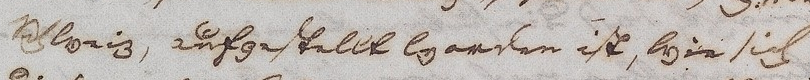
Schweiz, aufgestellt worden ist, wie sich
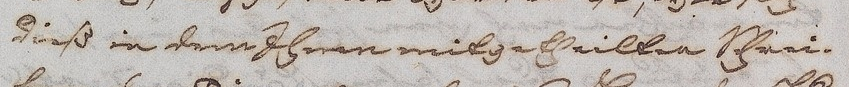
dieß in dem Ihnen mitgetheilten Schrei-
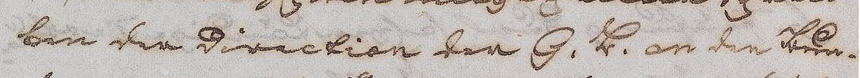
ben der Direction der G.B. an den Bun-
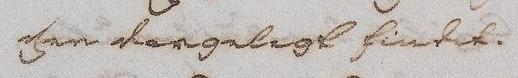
chen dargelegt findet.
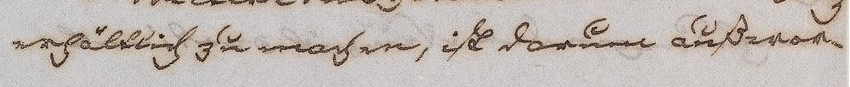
erhältlich zu machen, ist darum außeror-
